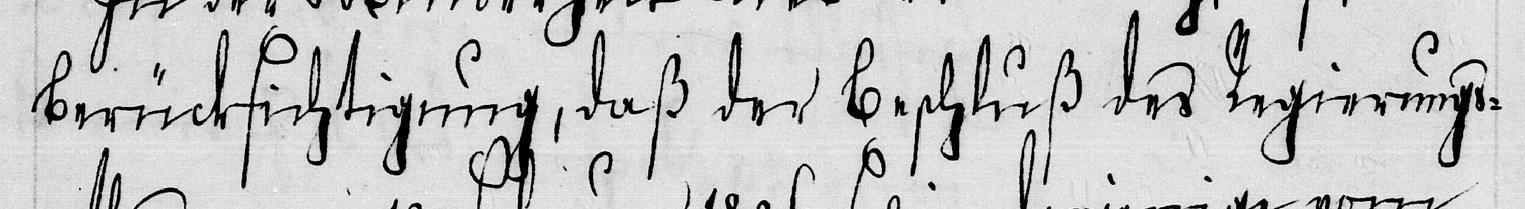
Berücksichtigung, daß der Beschluß des Regierungs¬
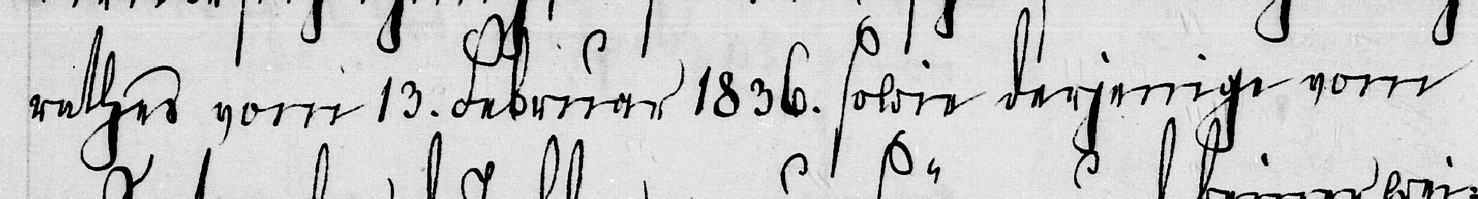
rathes vom 13. Februar 1836. sowie derjenige vom
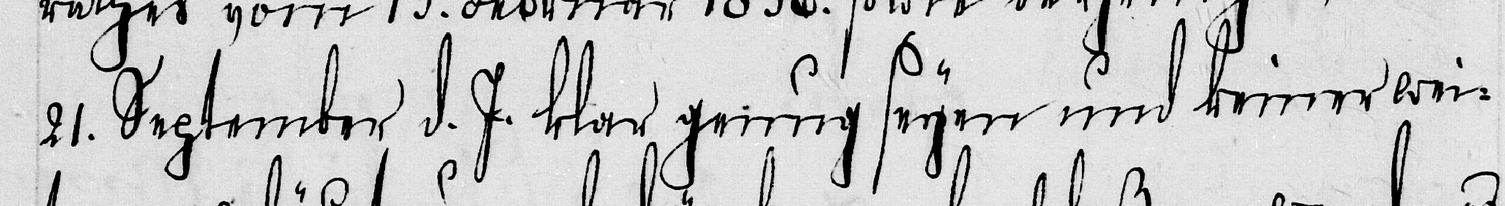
21. September d. J. klar genug seyen und keiner wei¬
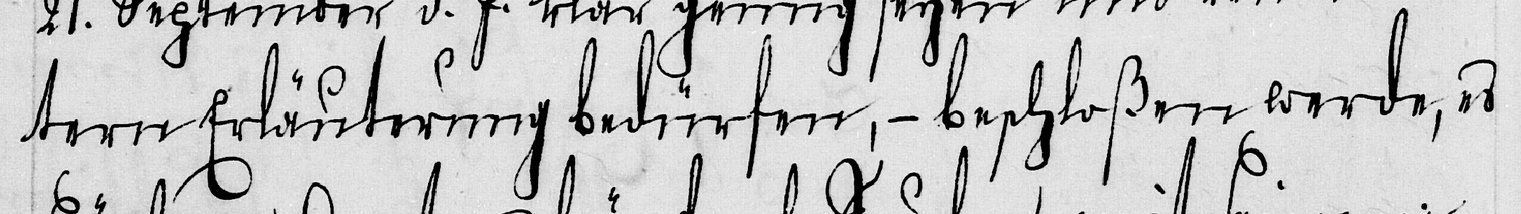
tern Erläuterung bedürfen, – beschloßen werde, es
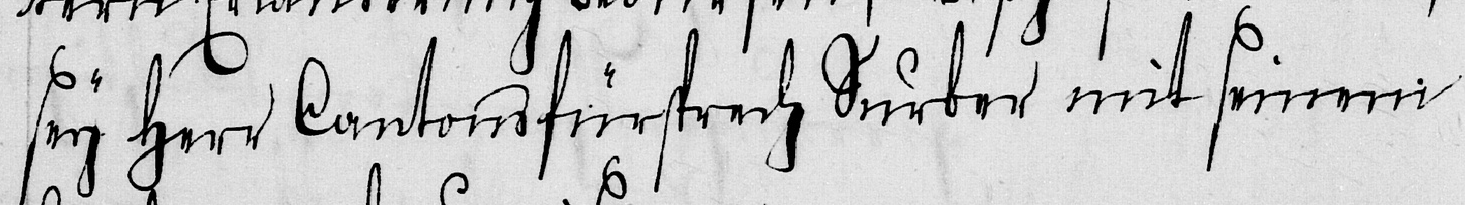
sey Herr Cantonsfürsprech Surber mit seinem
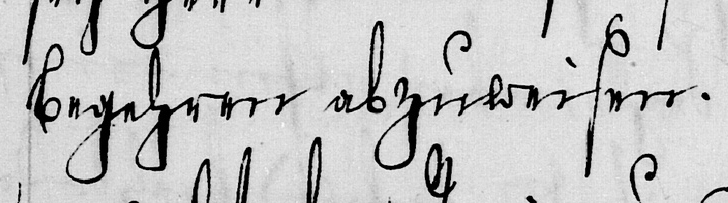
Begehren abzuweisen.
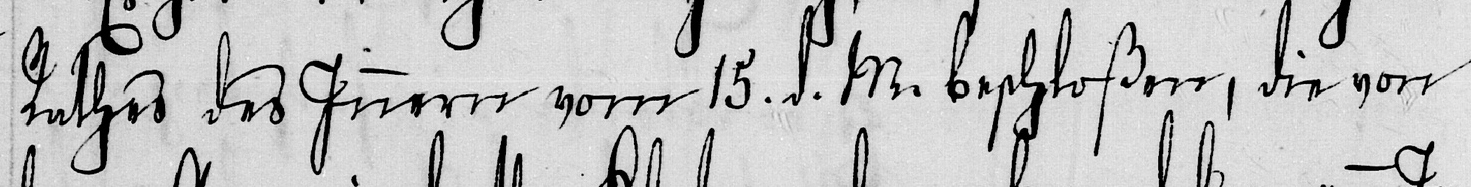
Rathes des Innern vom 15. d. M. beschloßen, die von
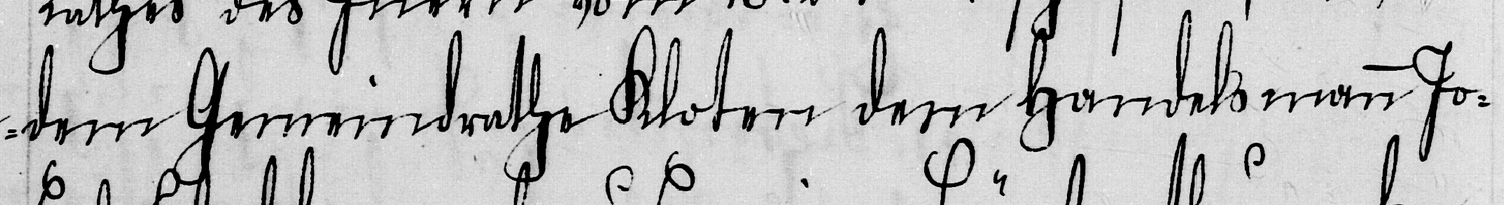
dem Gemeindrathe Kloten dem Handelsmann Jo¬
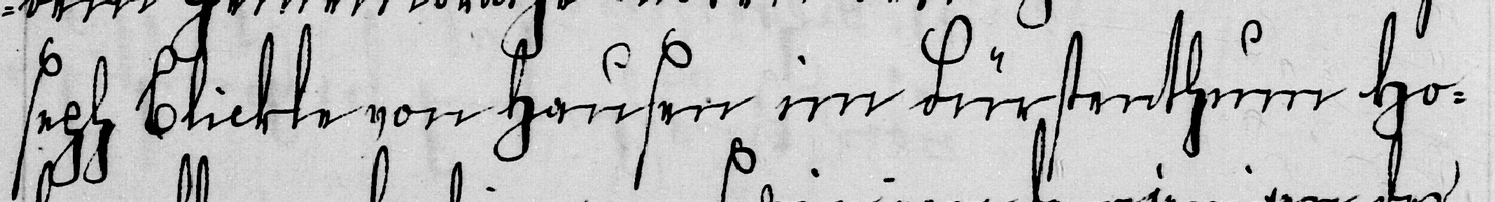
seph Blickle von Hausen im Fürstenthum Hoh¬
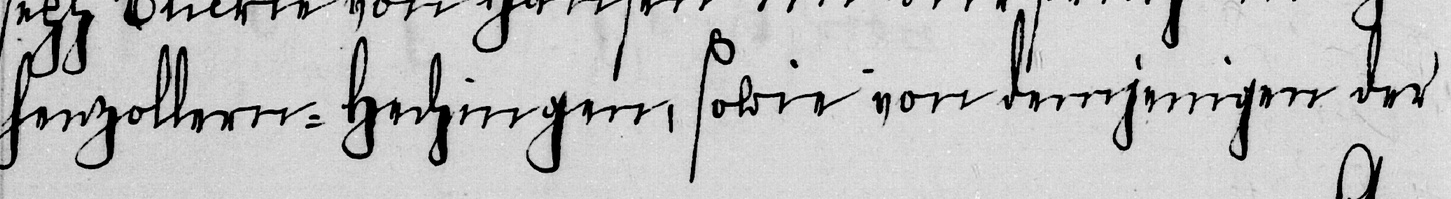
enzollern-Hechingen, sowie von demjenigen der
